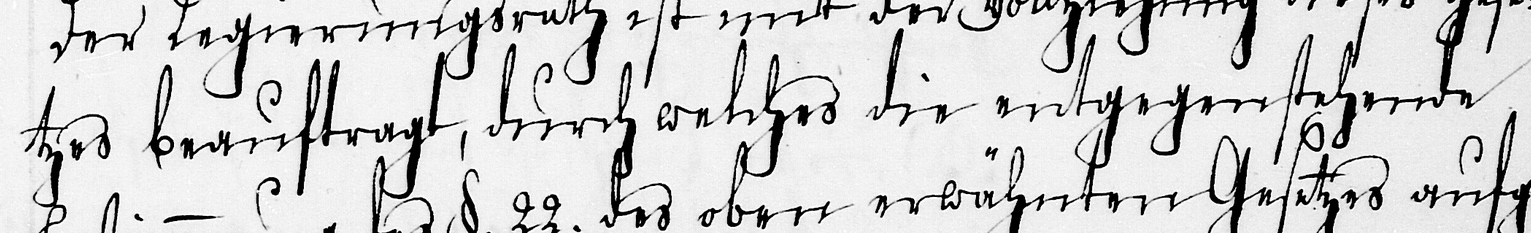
tzes beauftragt, durch welches die entgegenstehende
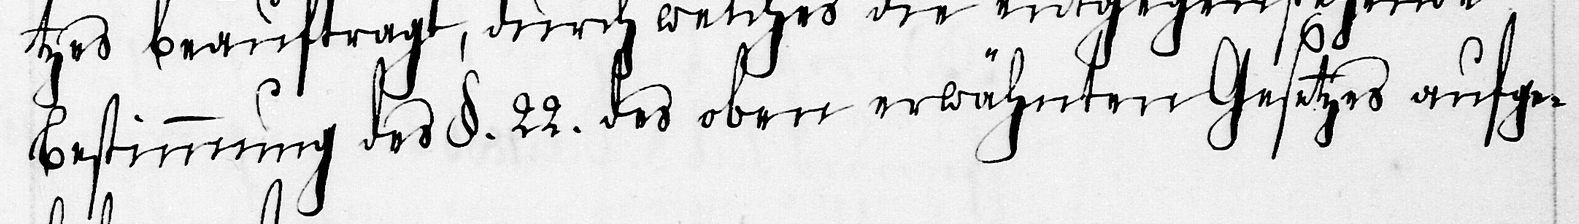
Bestimmung des §. 22. des oben erwähnten Gesetzes aufge¬
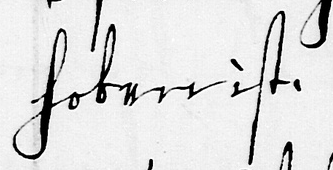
hoben ist.
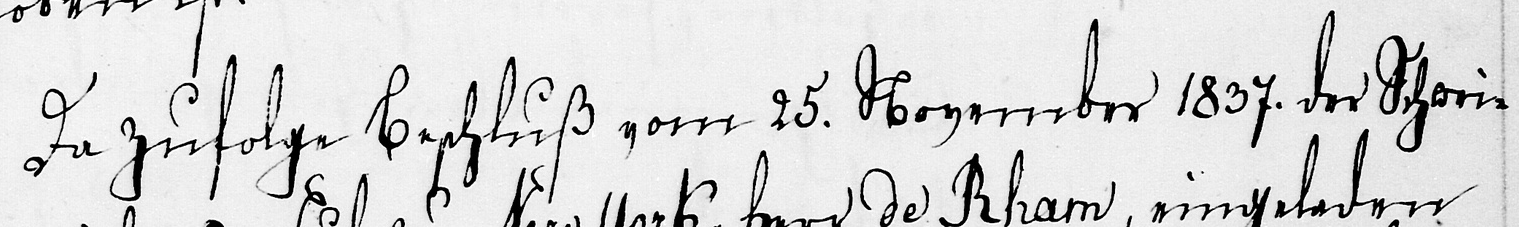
Da zufolge Beschluß vom 25. November 1837. der Schwei¬
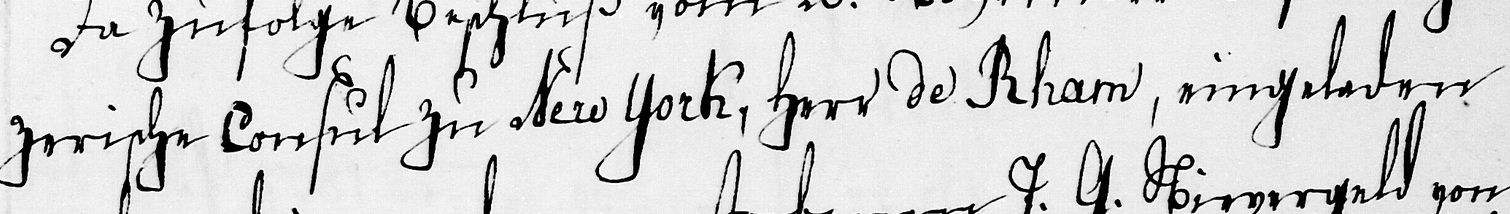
zerische Consul zu New York, Herr de Rham, eingeladen
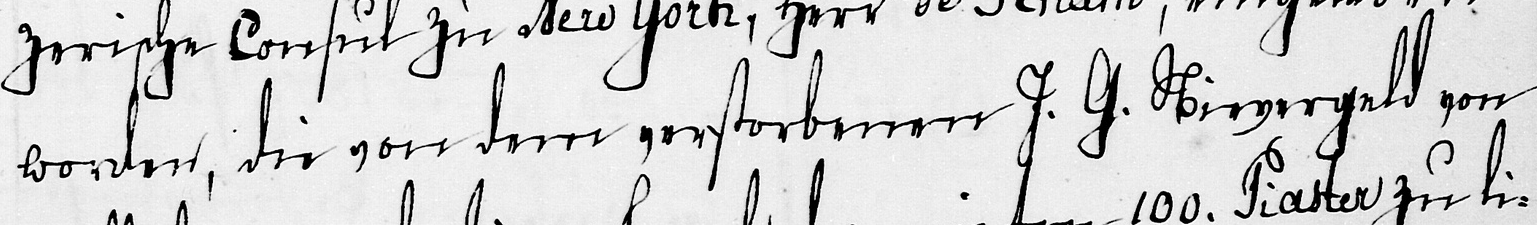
worden, die von dem verstorbenen J. G. Nievergeld von
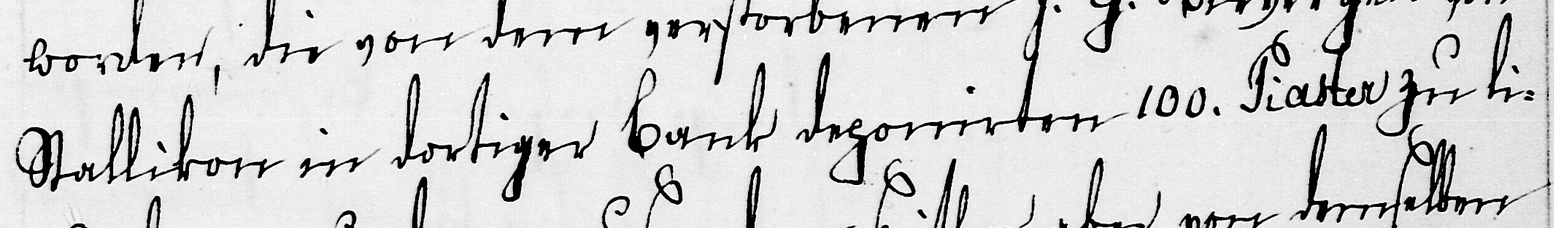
Stallikon in dortiger Bank deponirten 100. Piaster zu li¬
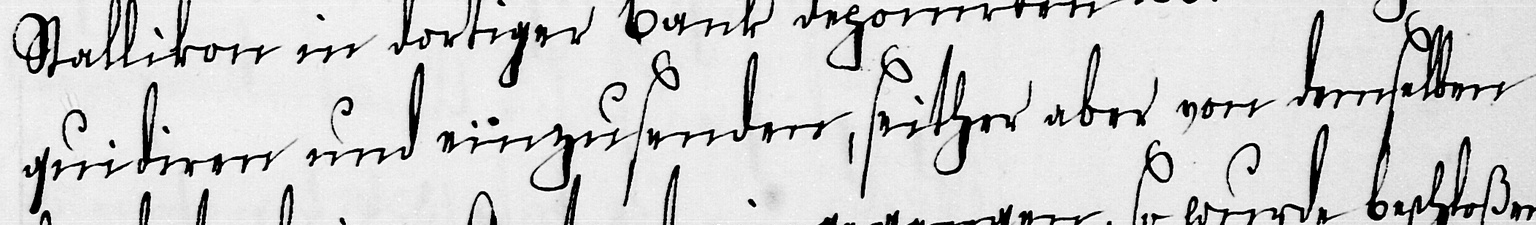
quidiren und einzusenden, seither aber von demselben
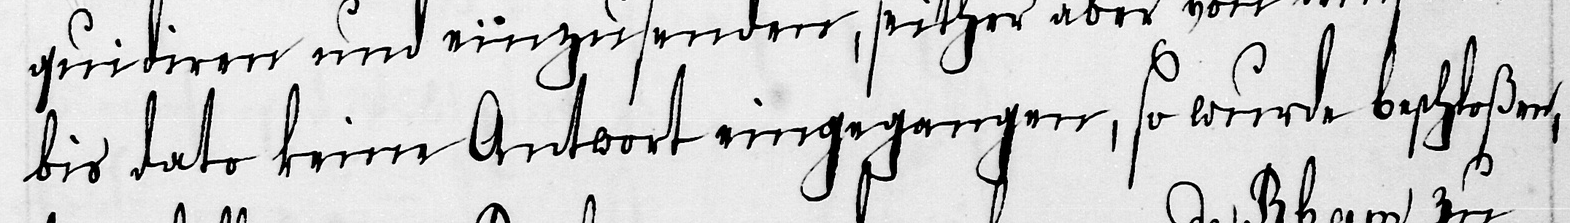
bis dato keine Antwort eingegangen, so wurde beschloßen,
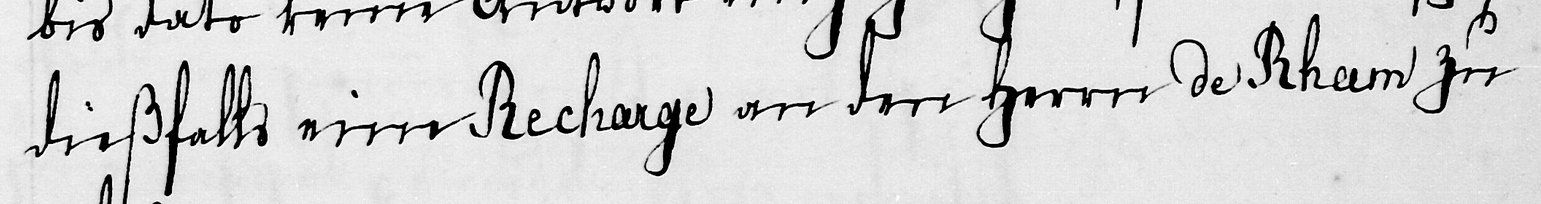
dießfalls eine Recharge an den Herrn de Rham zu
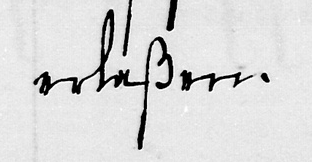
erlaßen.
